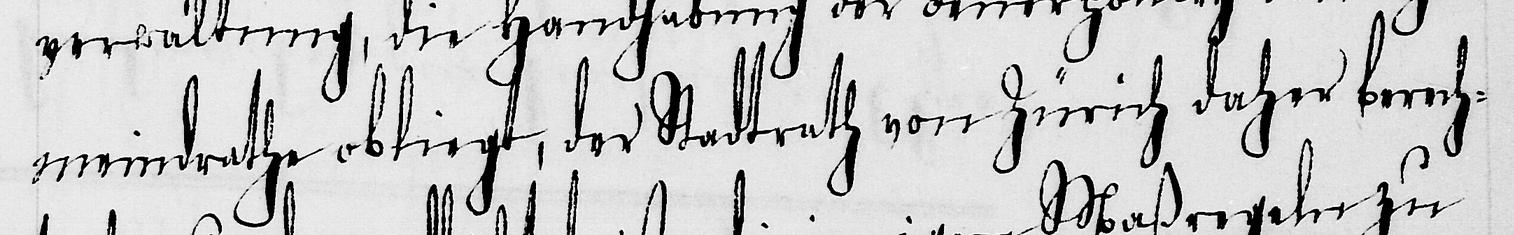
meindrathe obliegt, der Stadtrath von Zürich daher berech¬
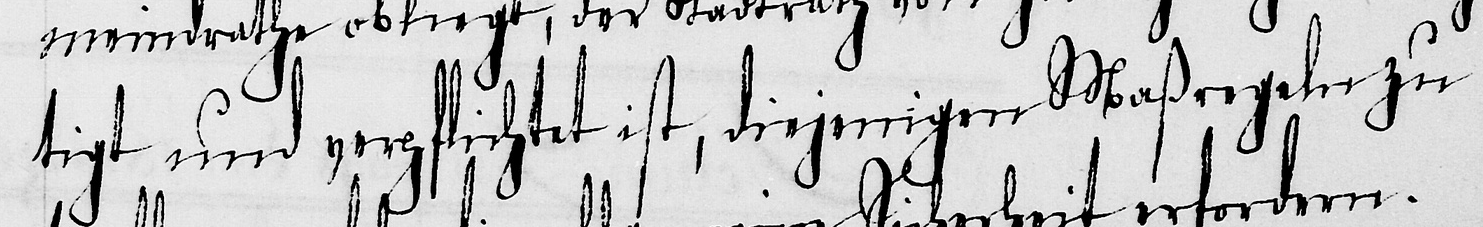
tigt und verpflichtet ist, diejenigen Maßregeln zu
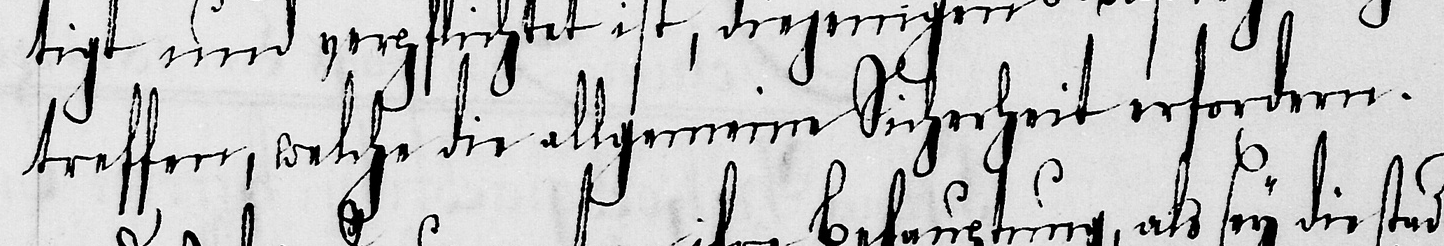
treffen, welche die allgemeine Sicherheit erfordern.
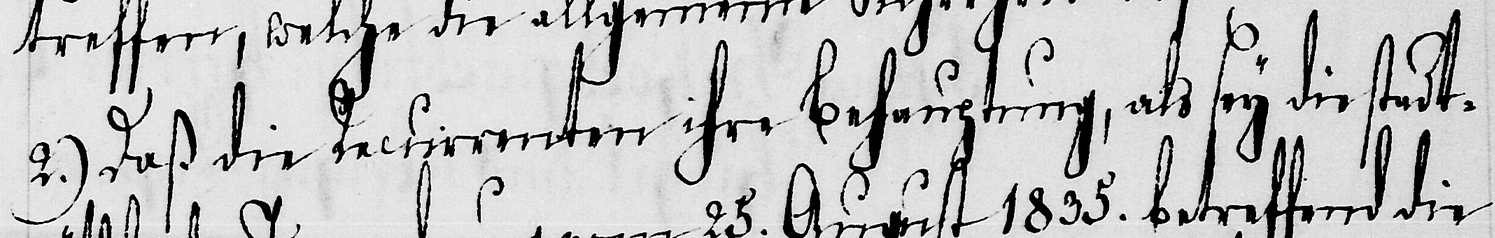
2.) Daß die Recurrenten ihre Behauptung, als sey die stadt¬
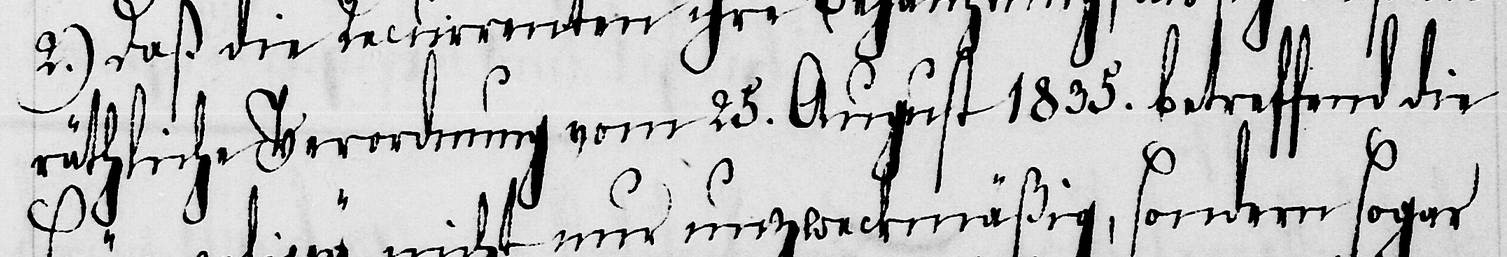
räthliche Verordnung vom 25. August 1835. betreffend die
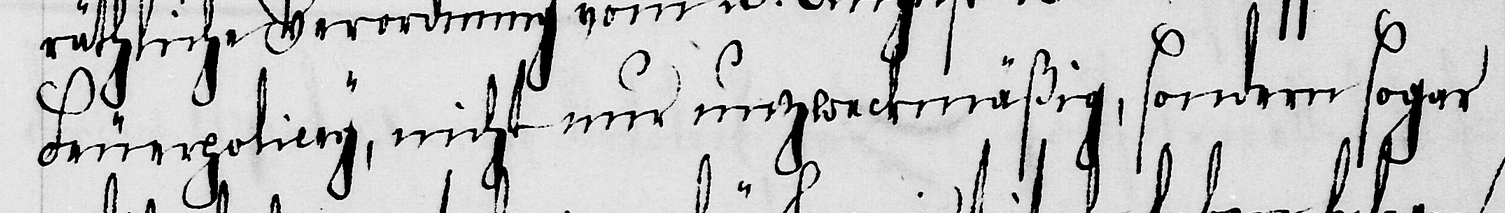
Feuerpolicey, nicht nur unzweckmäßig, sondern sogar
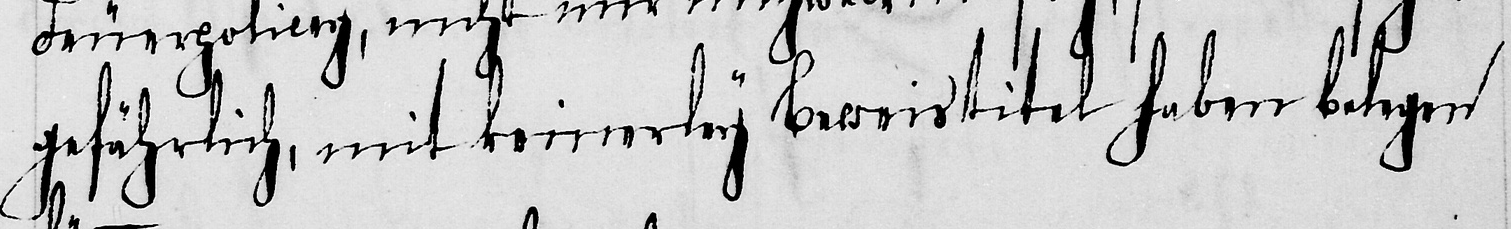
gefährlich, mit keinerley Beweistitel haben belegen
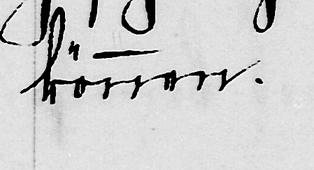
können.
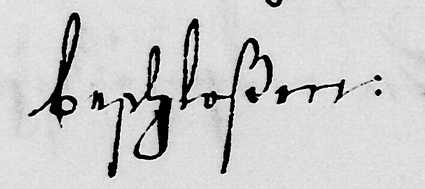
beschloßen:
